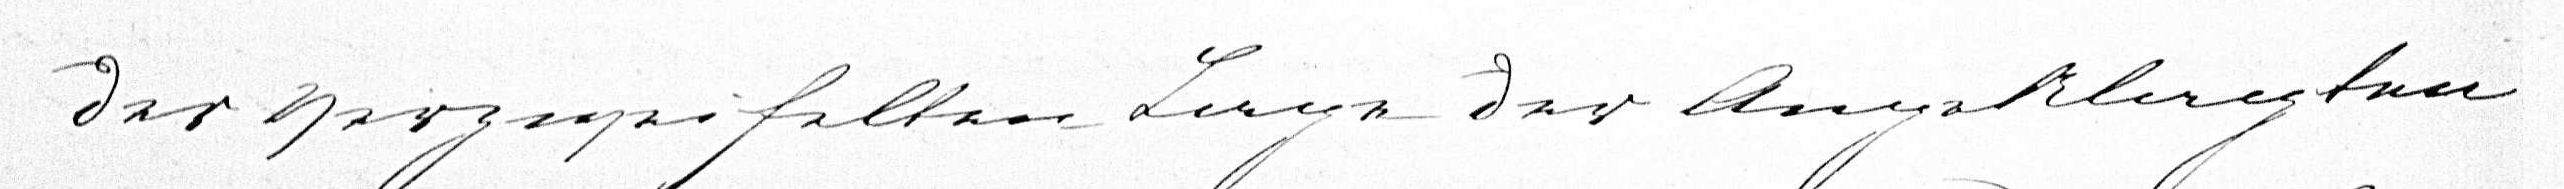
der verzweifelten Lage der Angeklagten
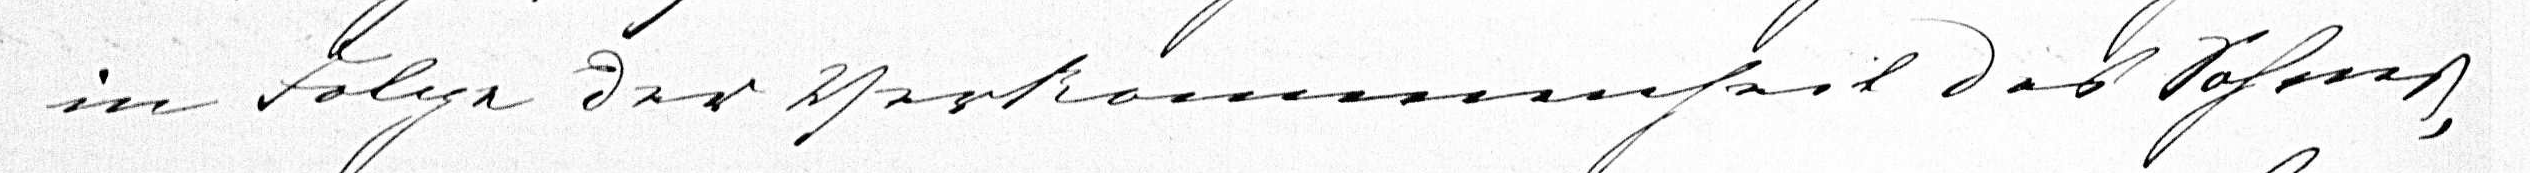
in Folge der Verkommenheit des Sohnes
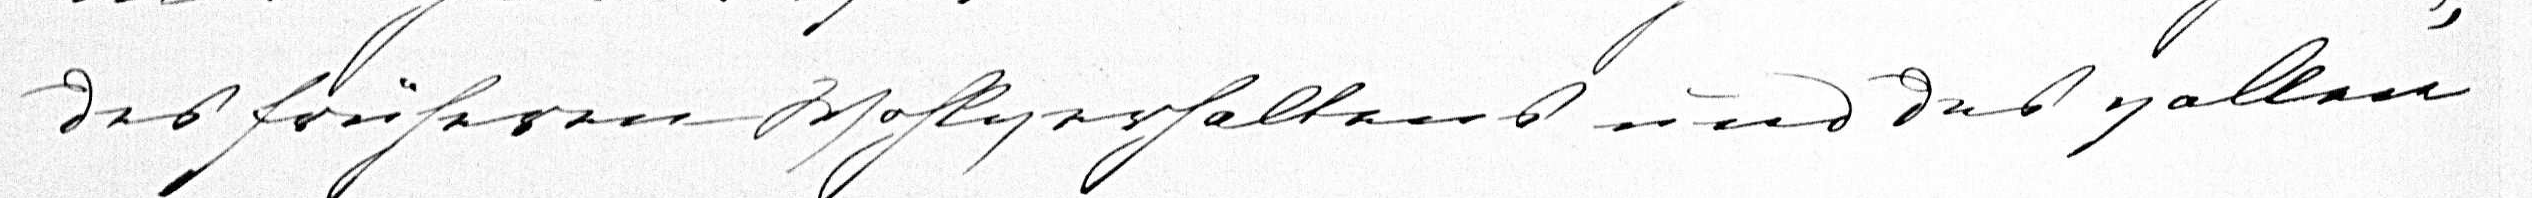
des früheren Wohlverhaltens und des vollen
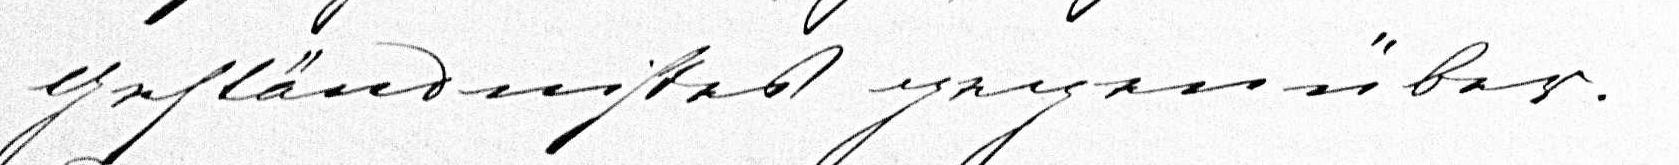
Geständnistes gegenüber.
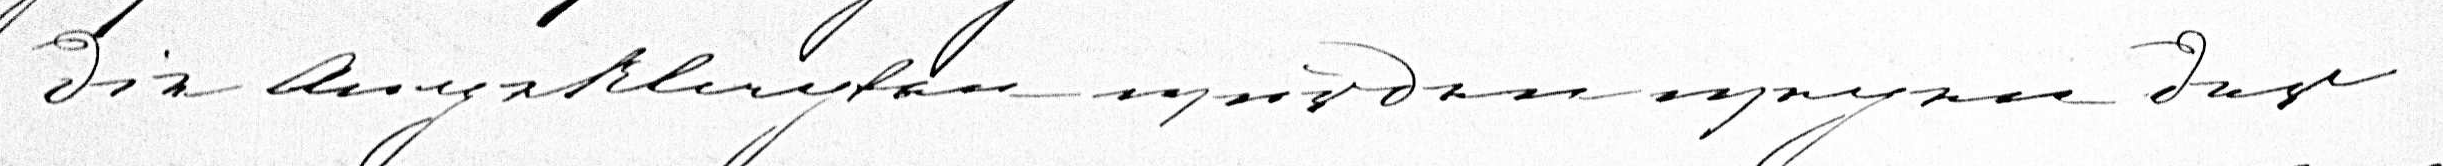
Die Angeklagten wurden wegen der
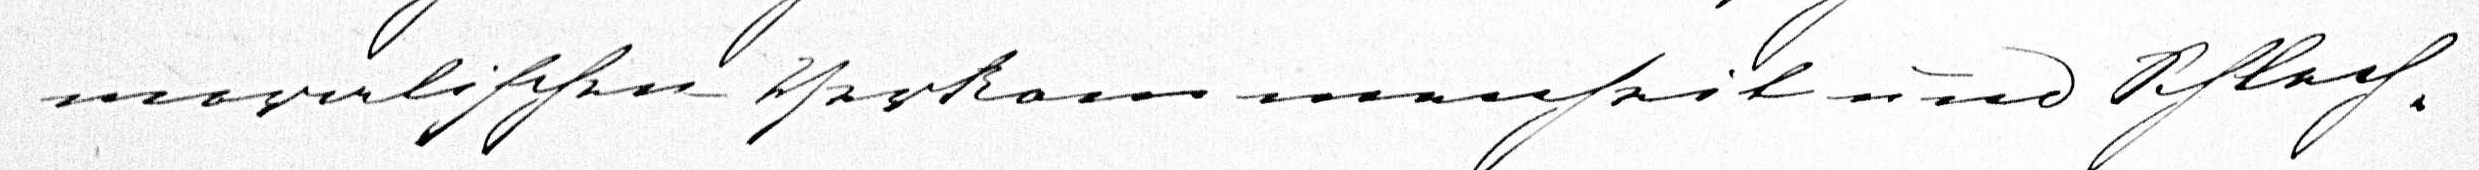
moralischen Verkommenheit und Schlech¬
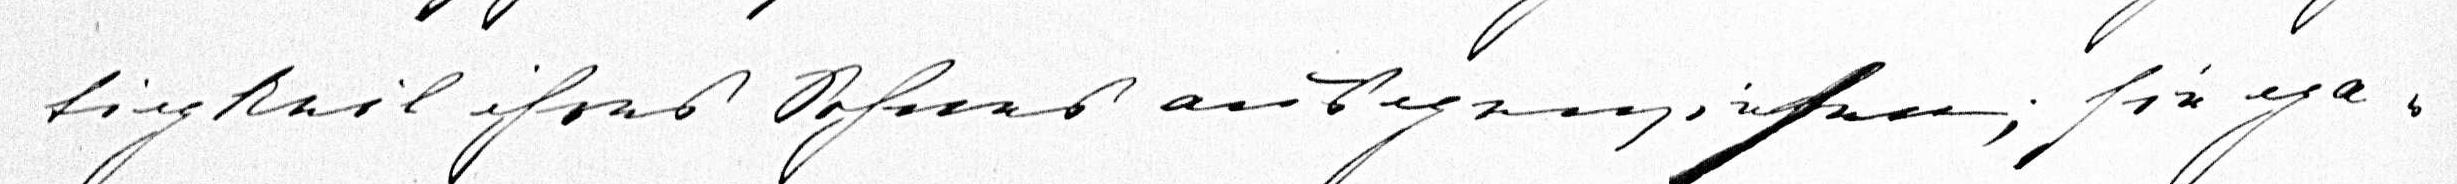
tigkeit ihres Sohnes aus gewiesen; sie ga¬
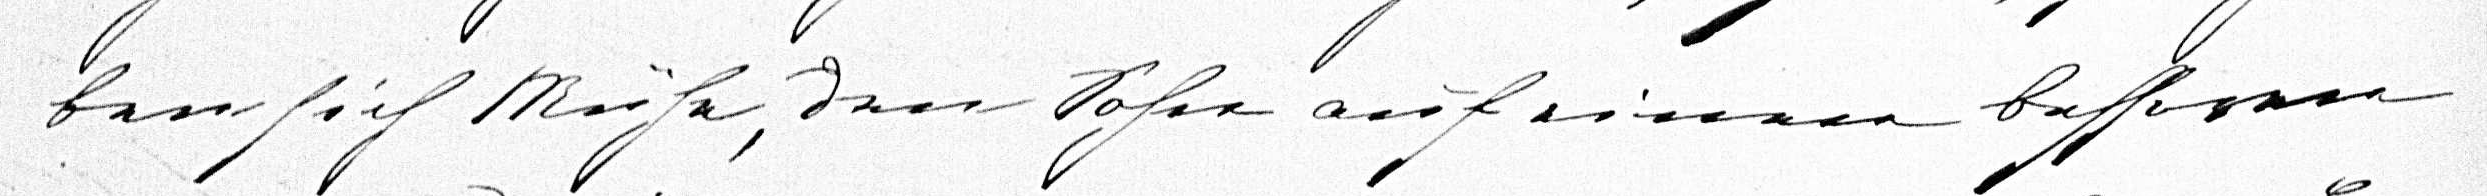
ben sich Mühe, den Sohn auf einen Besseren
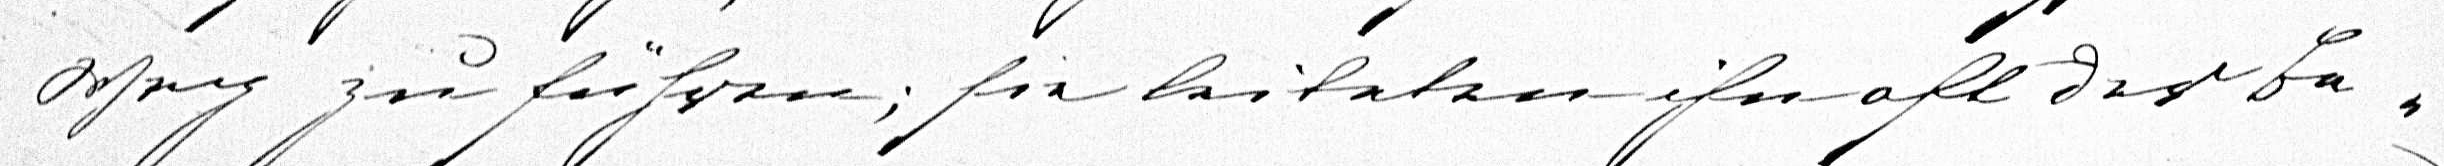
weg zu führen; sie leiteten ihn oft der Be¬
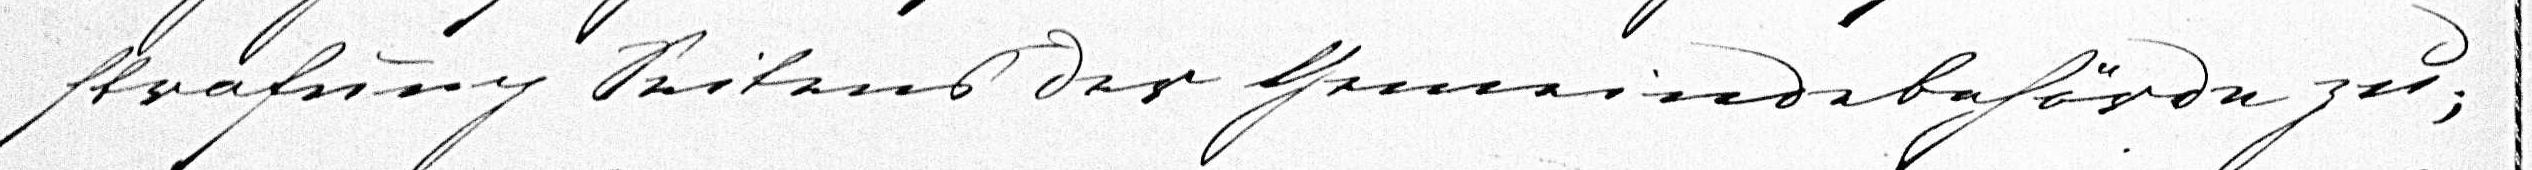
strafung Seitens der Gemeindebehörde zu;
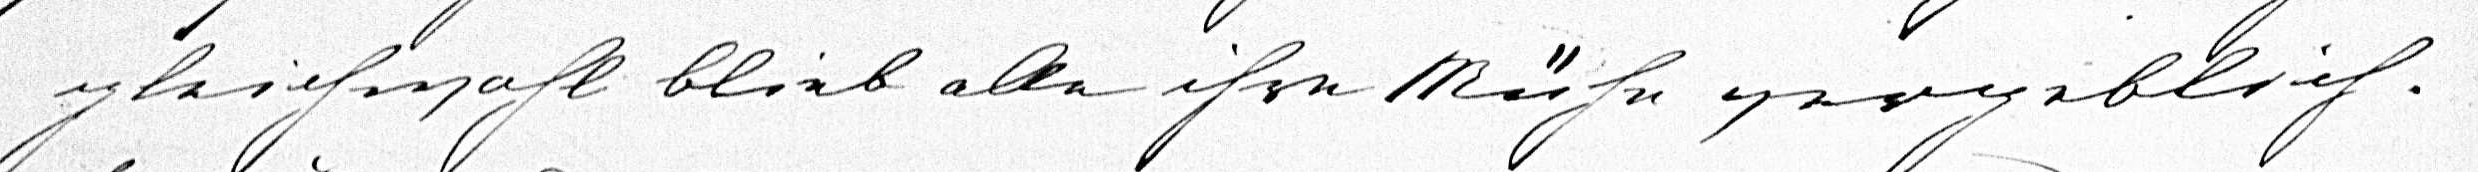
gleichwohl blieb alle ihre Mühe vergeblich.
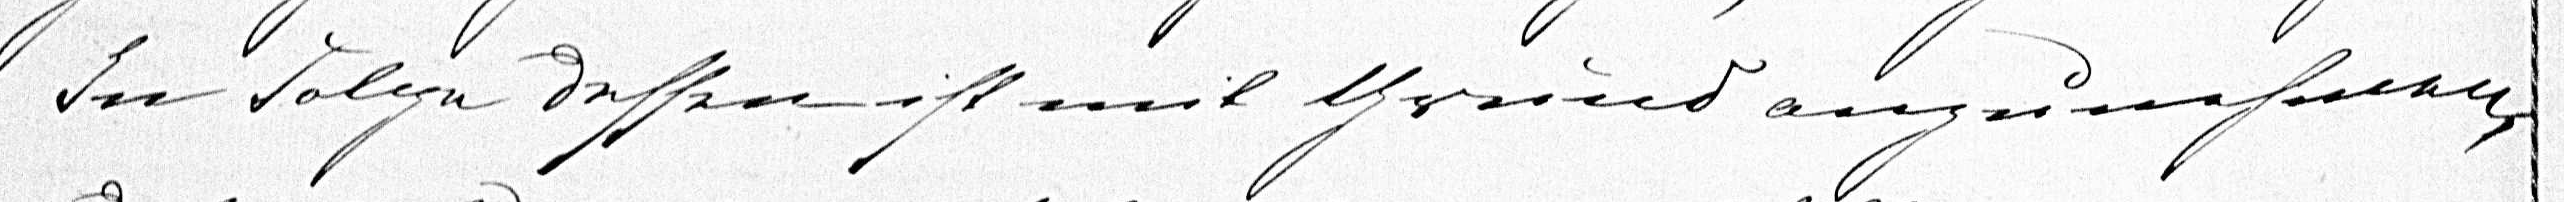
In Folge dessen ist mit Grund anzumxxmen¬
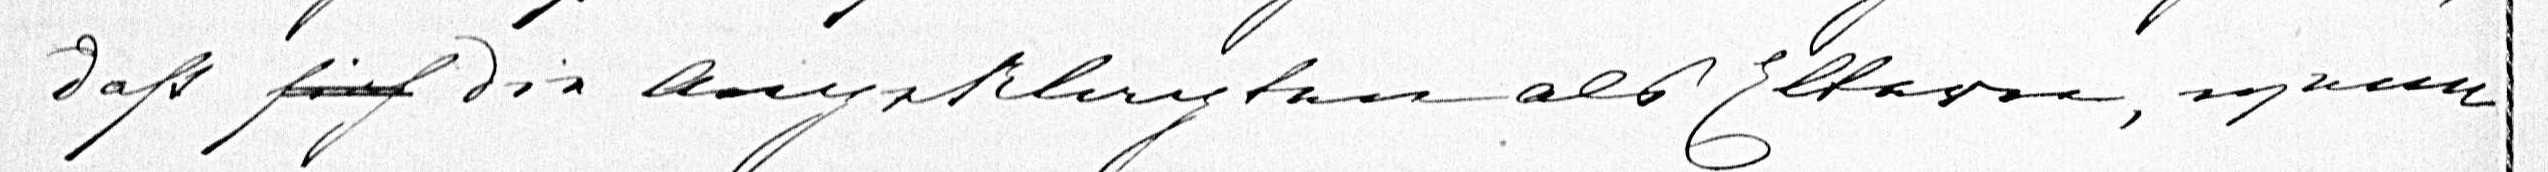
dast sich die Angeklagten als Eltern, wenn
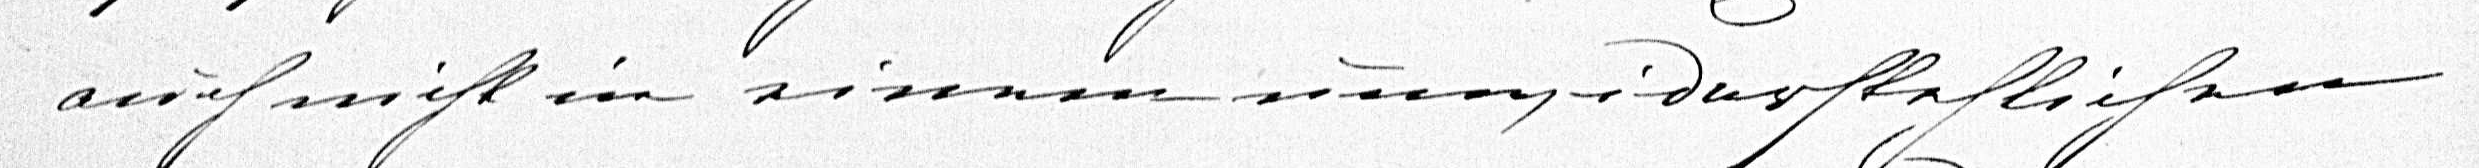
auch nicht in einem unwiderstehlichsten
